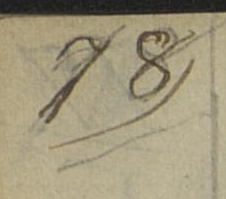78
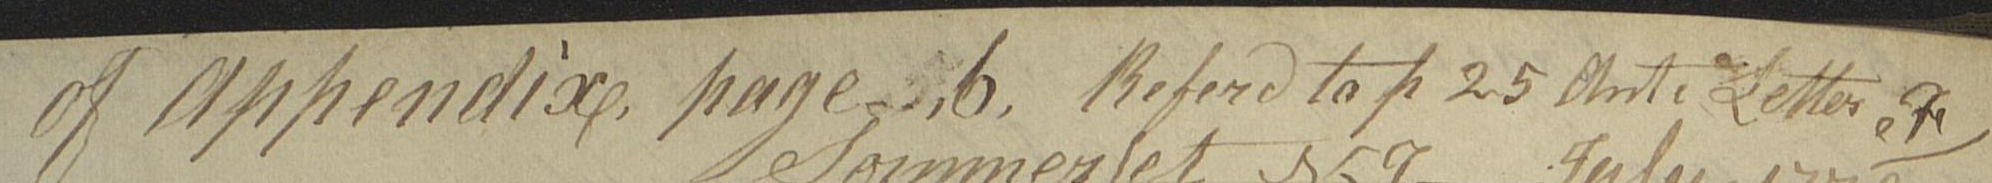of Appendix page 6. Referd to p25 Ante Letter F
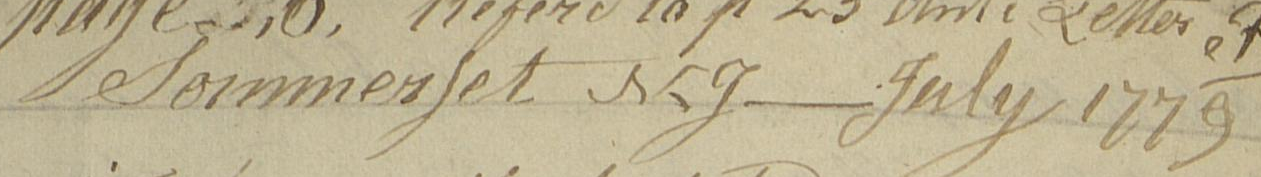Sommerset N.J July 1779
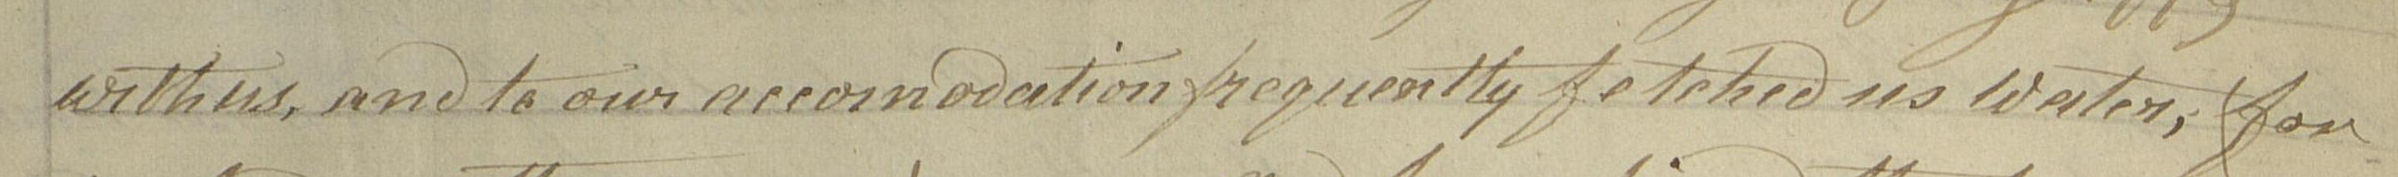with us, and to our accomodation frequently fetched us Water, (for
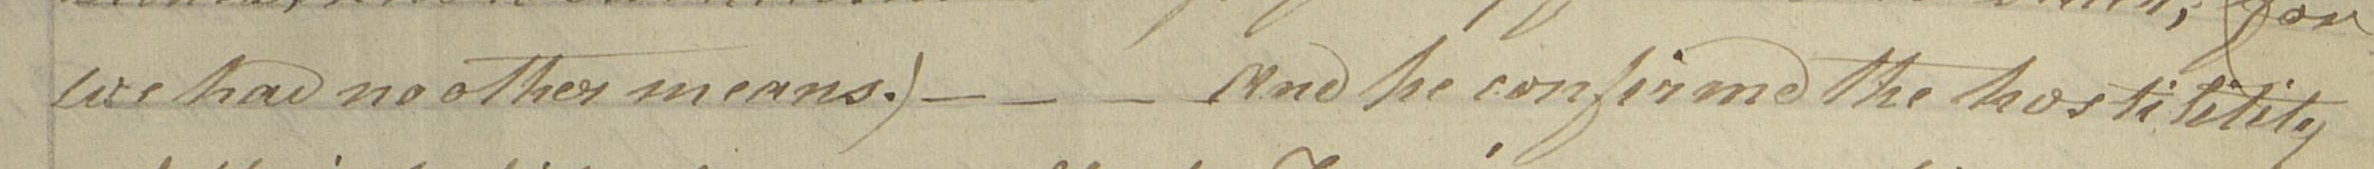we had no other means.) And he confirmd the hostilitity
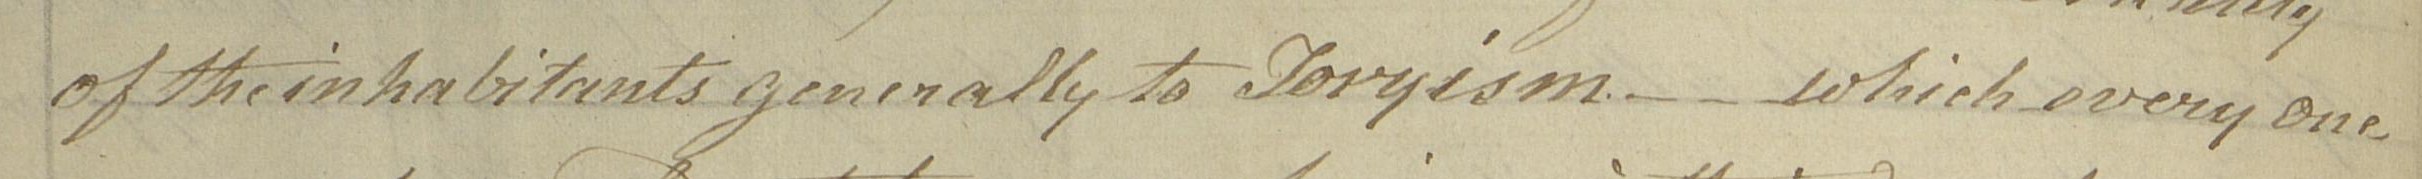of the inhabitants generally to Toryism which every one
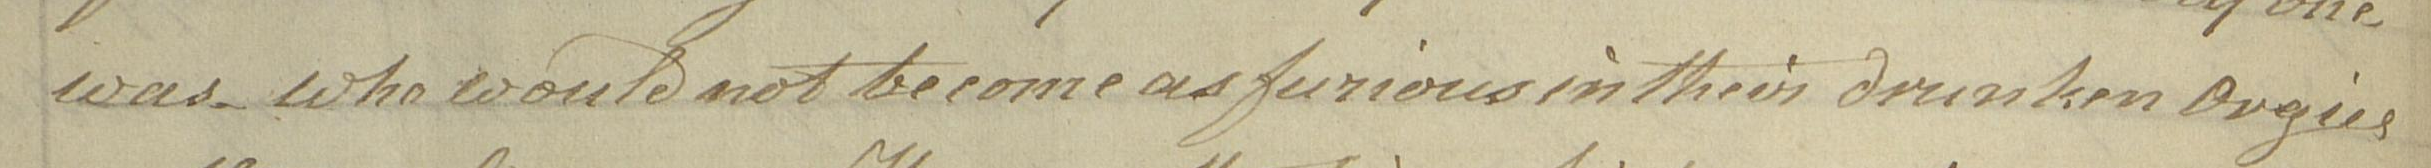was who would not become as furious in their drunken Orgies
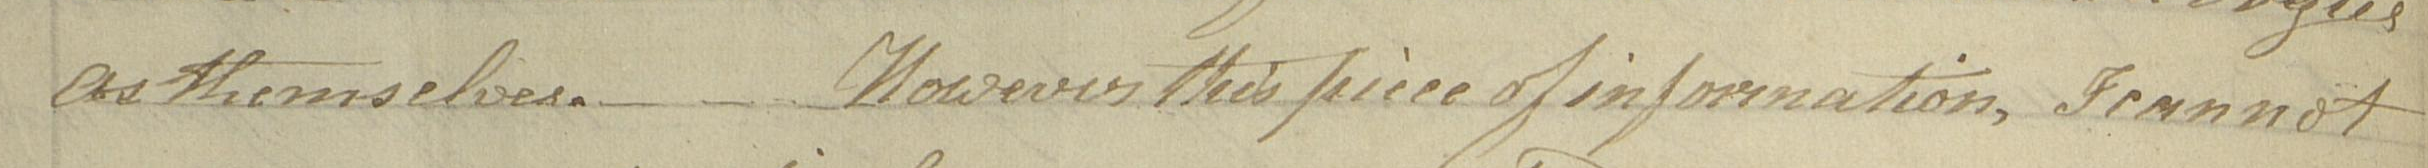As themselves. However this piece of information, I cannot
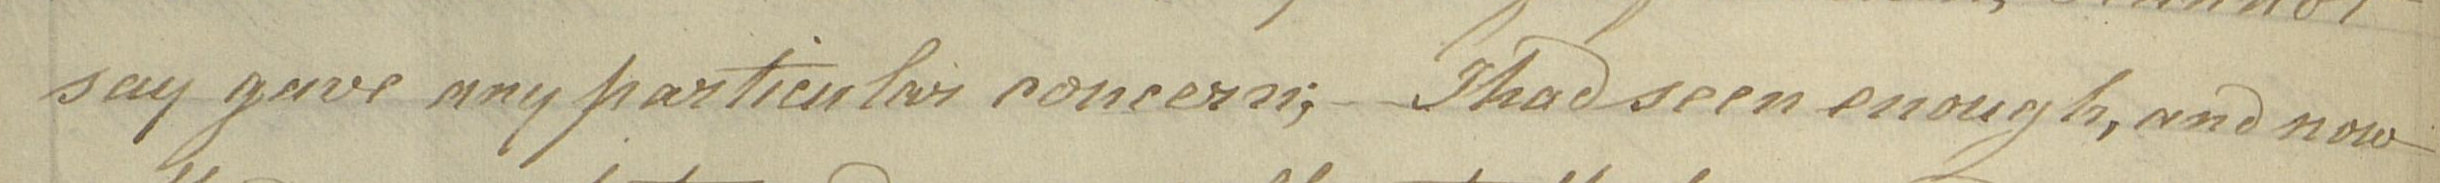say give any particular concern; I had seen enough, and now
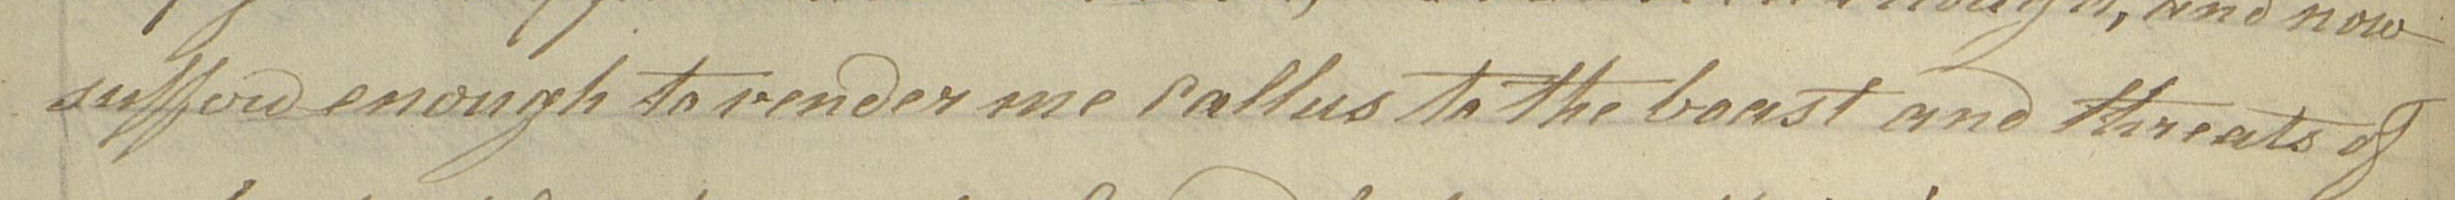suffered enough to render me call us to the boast and threats of
